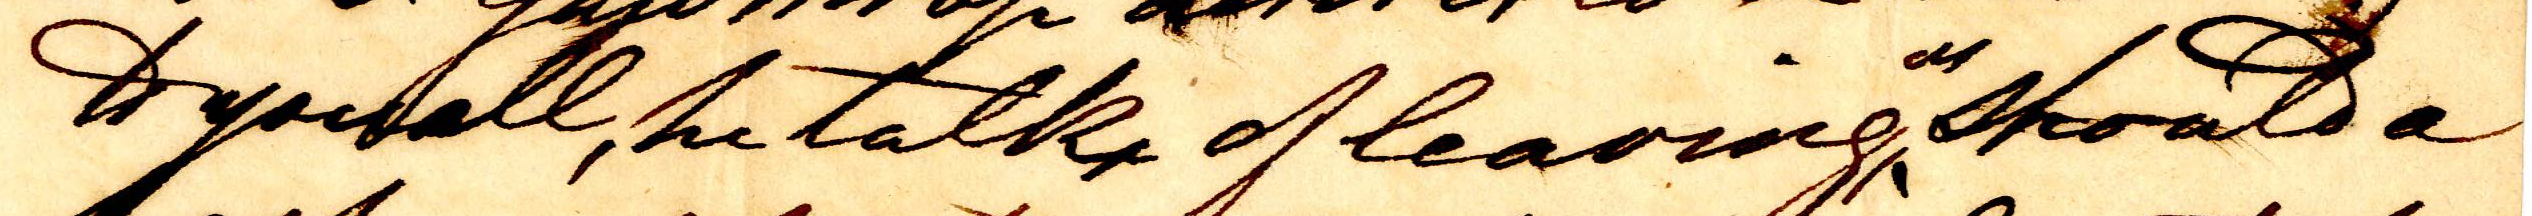to you all, he talks of leaving ^ should a
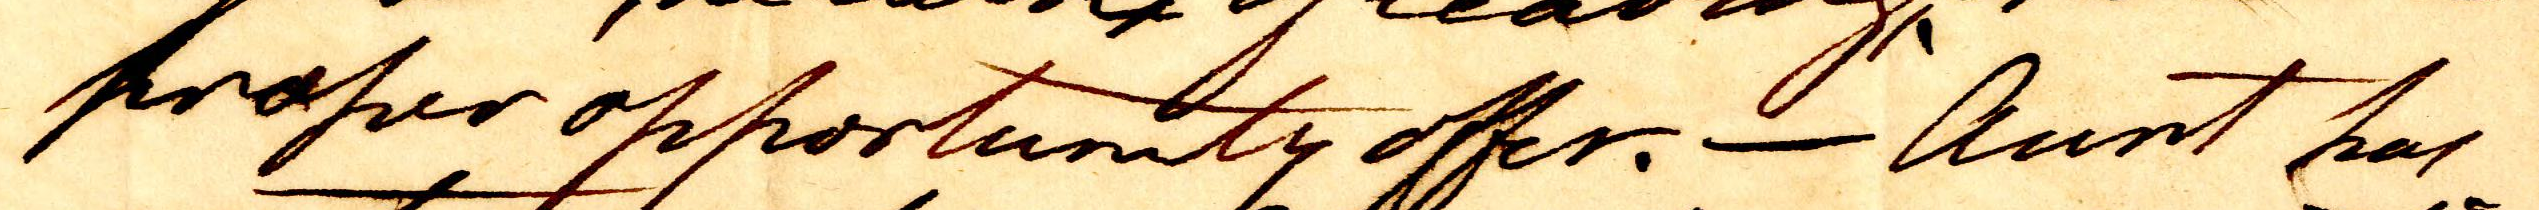proper opportunity offer.- Aunt has
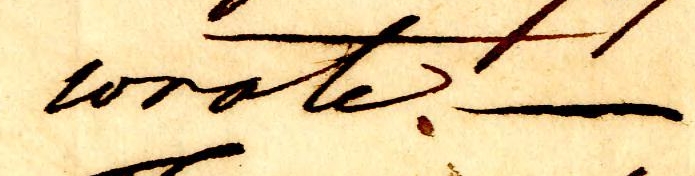wrote.
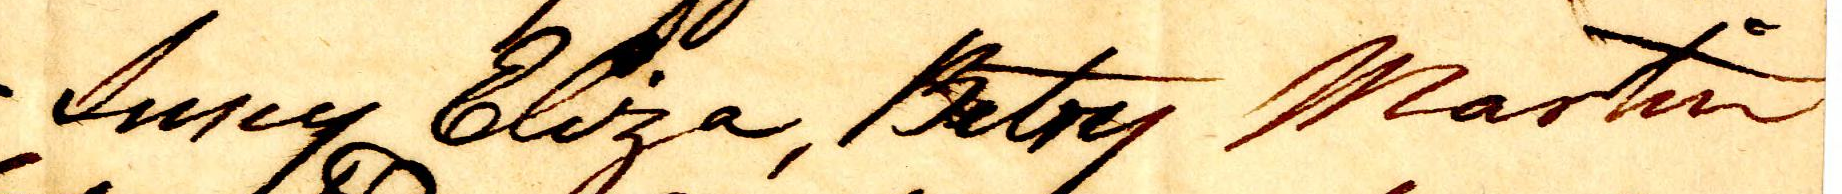Susey, Eliza, Betsy Martin
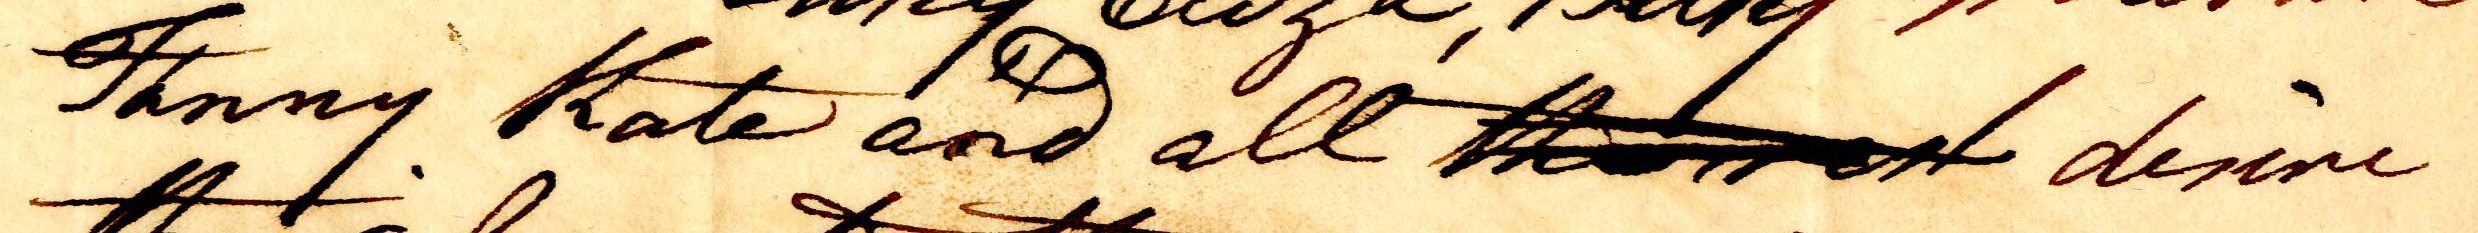Fanny Kate and [the rest] all desire
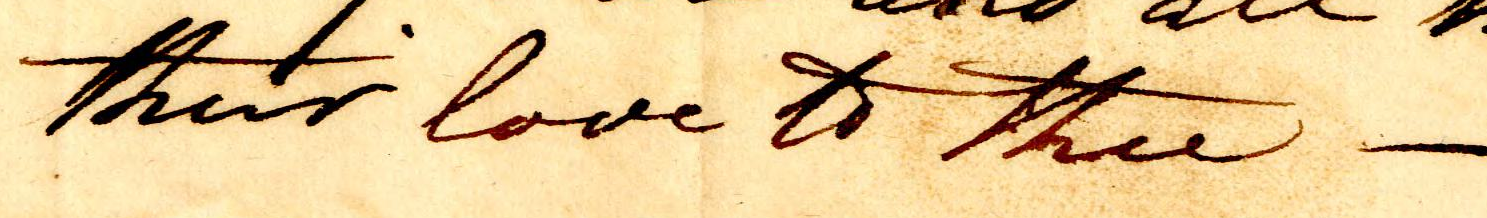their love to thee-
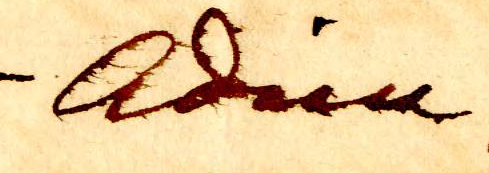Adieu
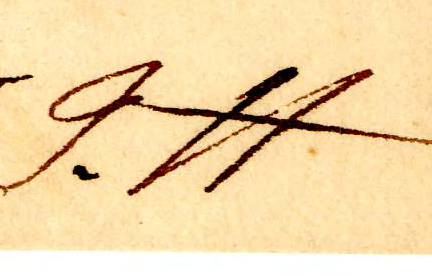J.H.
